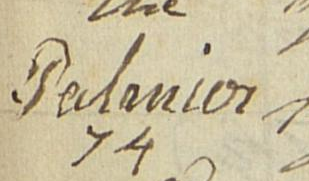Palmier
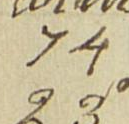74
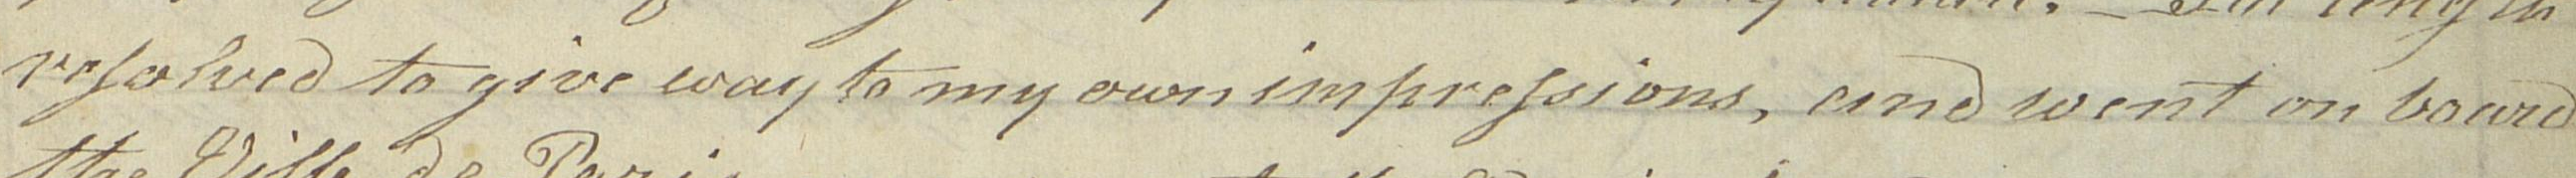resolved to give way to my own impressions, and went on board
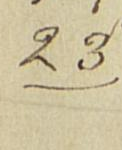23
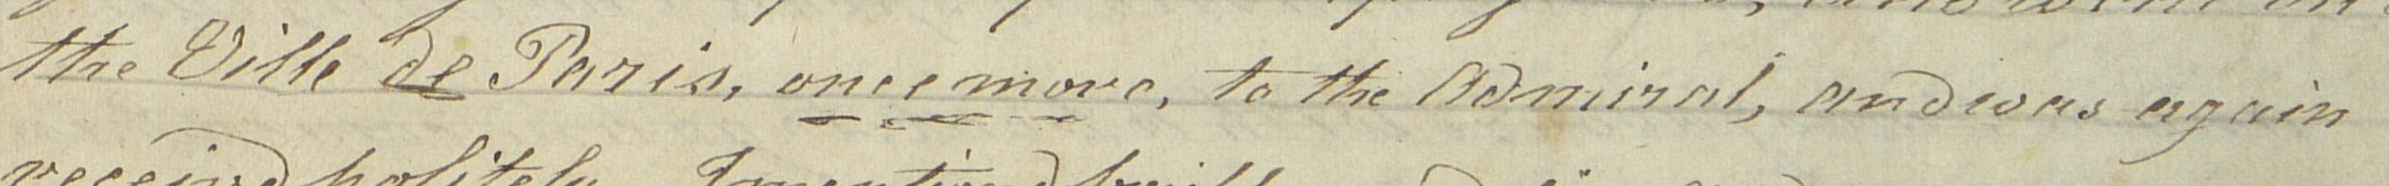the Ville de Paris, once more, to the Admiral, and was again
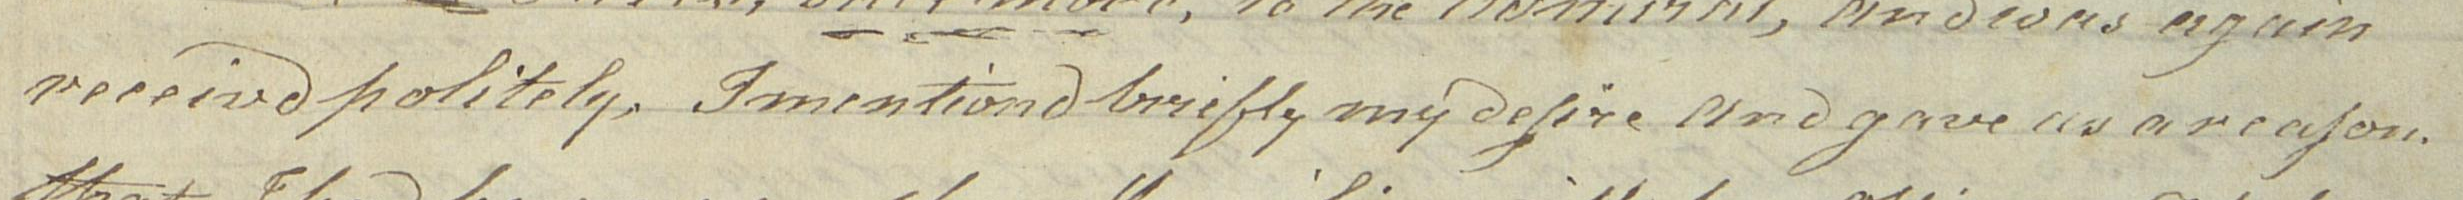received politely, I mentiond briefly my desire And gave us a reason
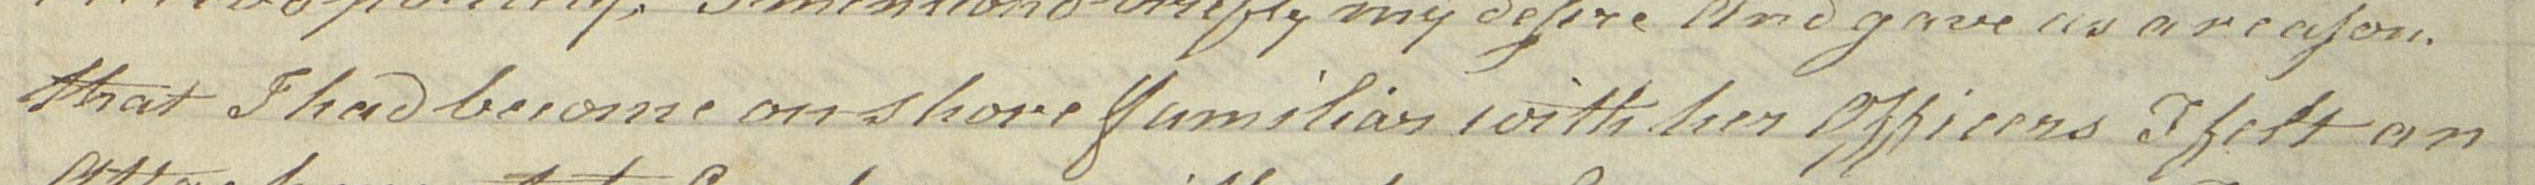that I had become on shore familiar with her Officers I felt an
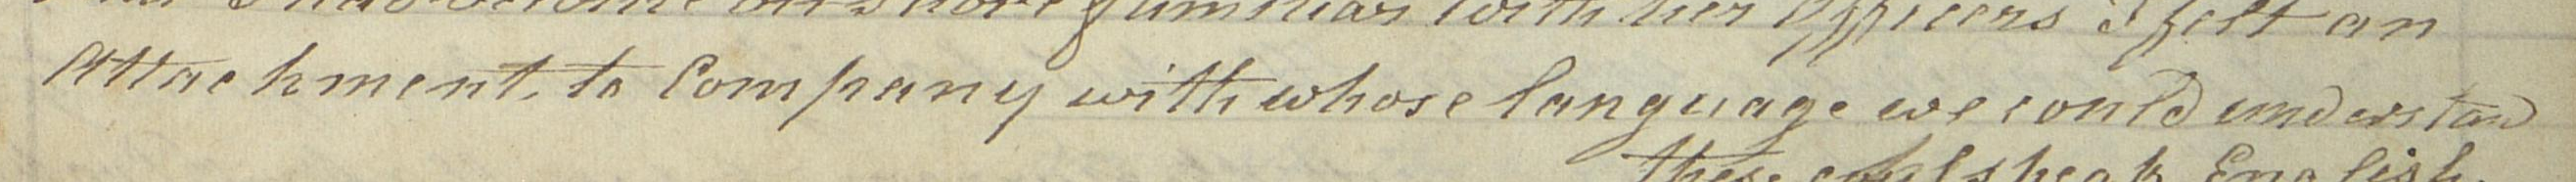Attachment to Company with whose language we could understand
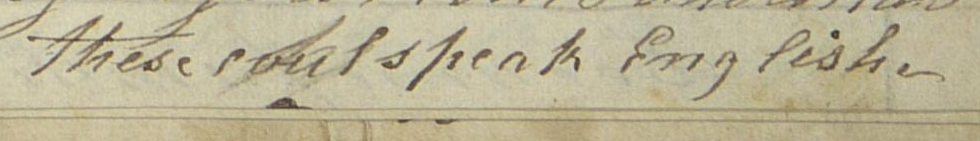these coul speak English
